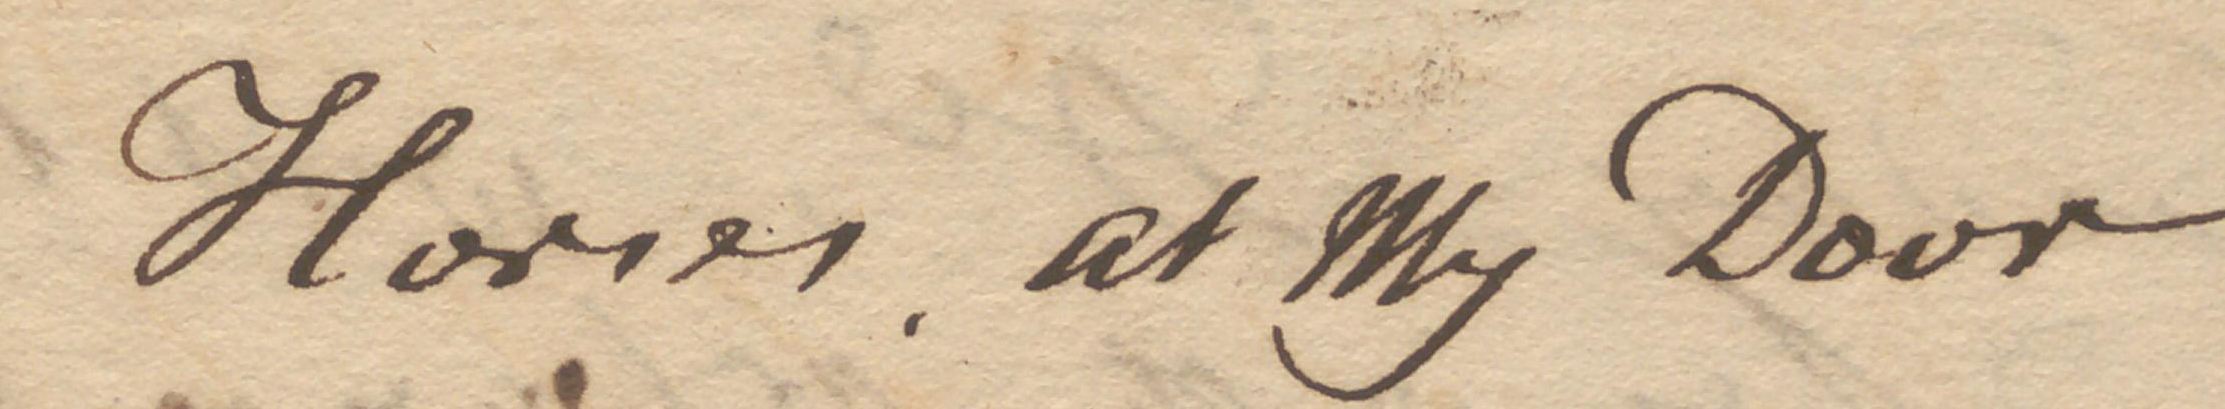Horses at My Door
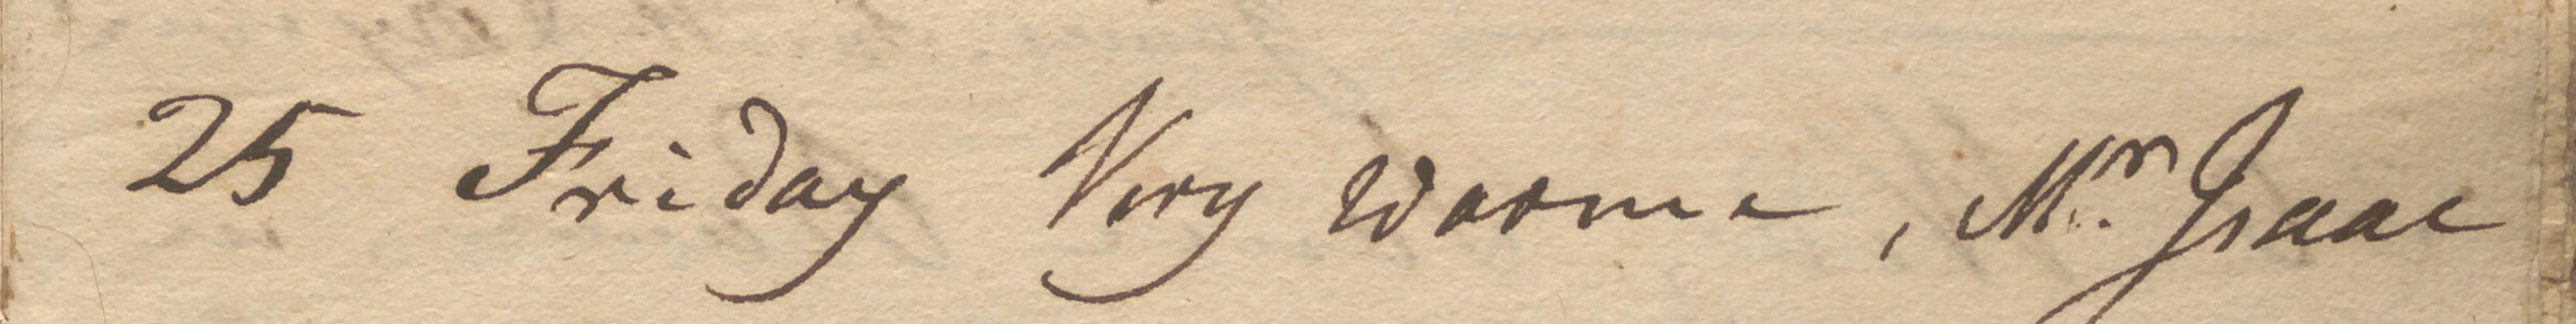25 Friday Very warme, M^r. Isaac
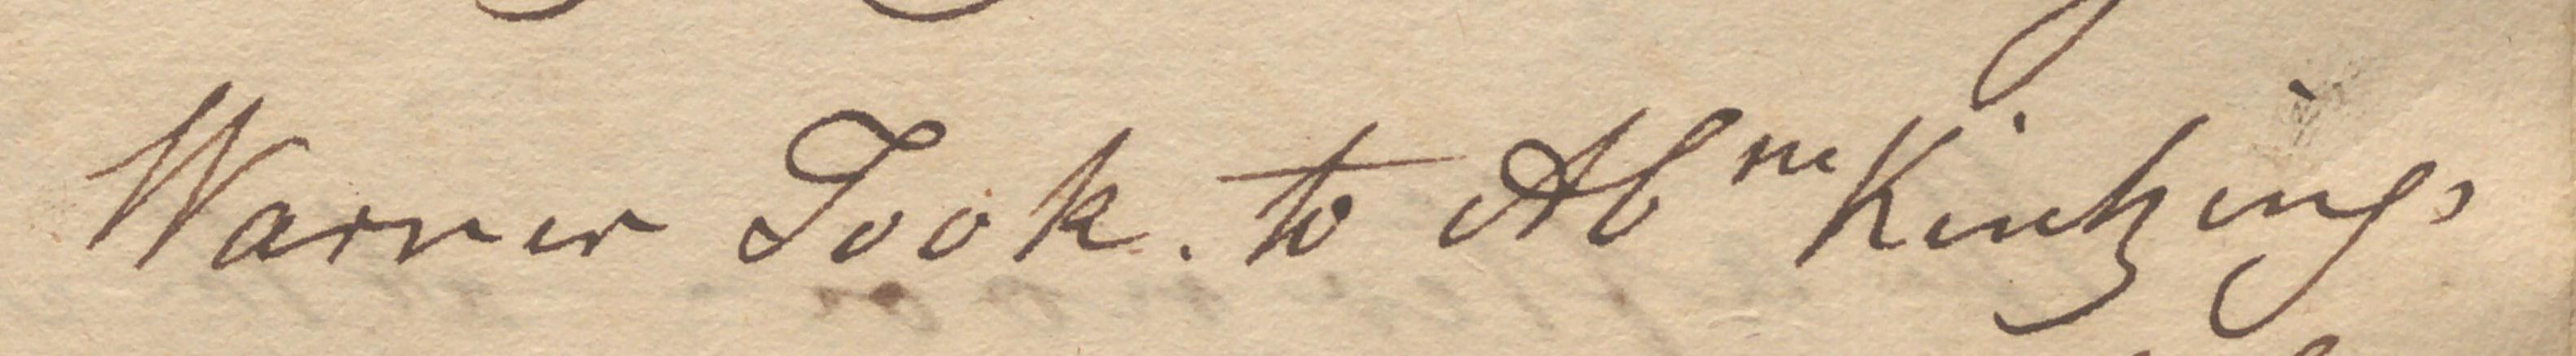Warner Took, to Ab^m Kintzings
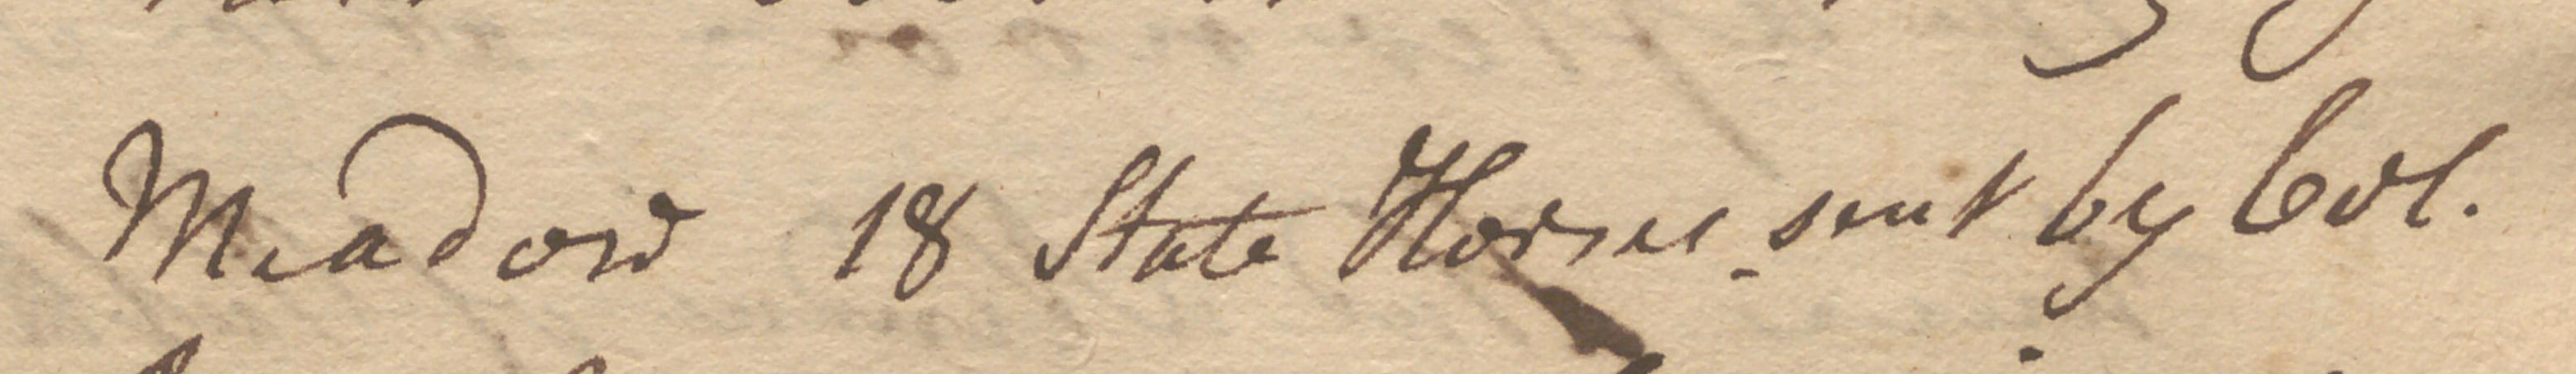Miadow 18 State Horses sent by Col.
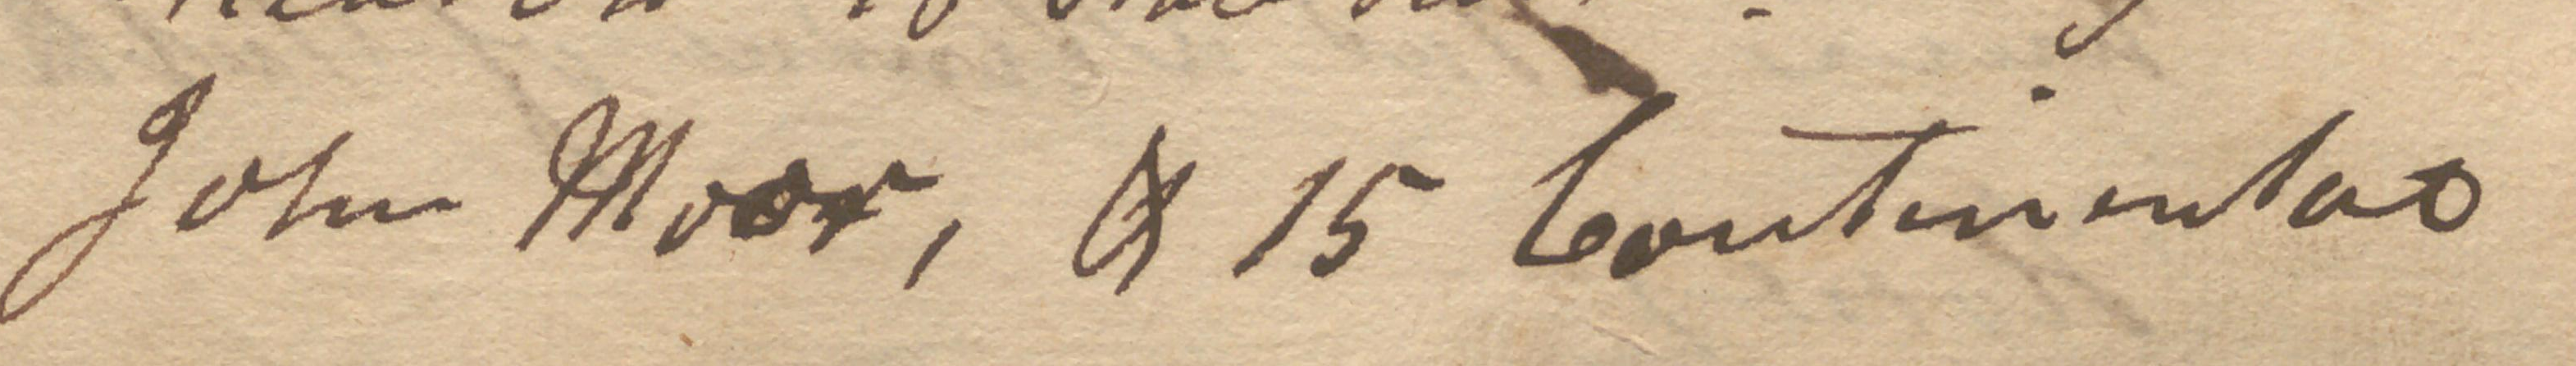John Moor, & 15 Continental
